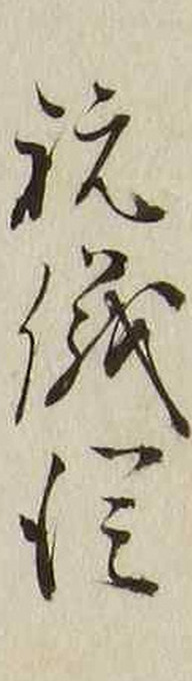祝儀従
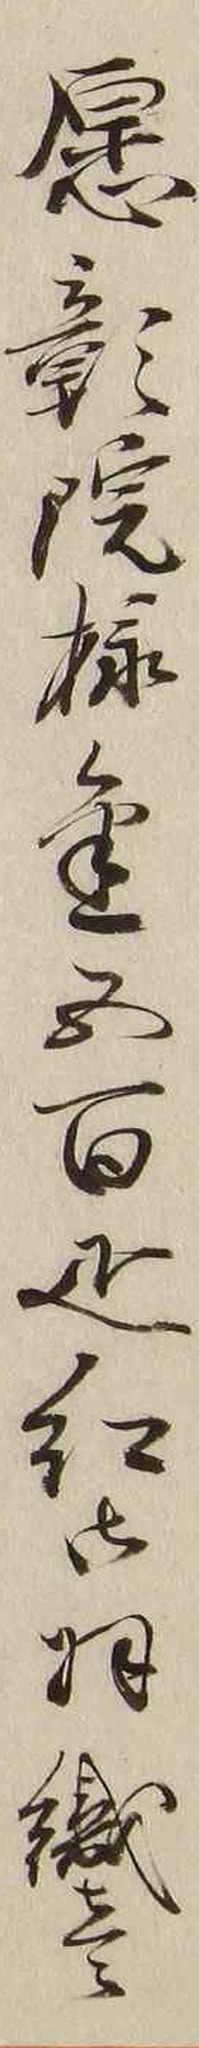愿彰院様金五百疋紅御羽織壱
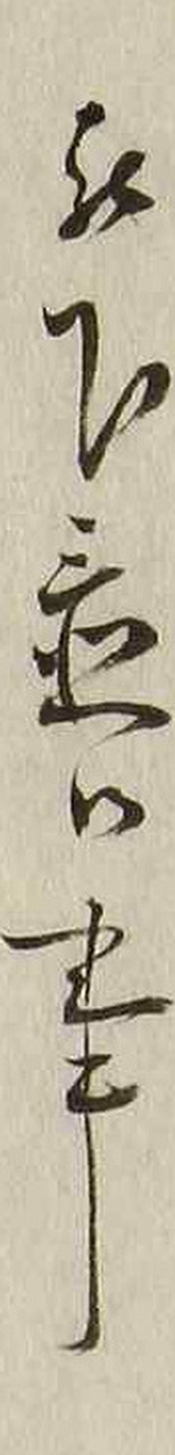被下置候事
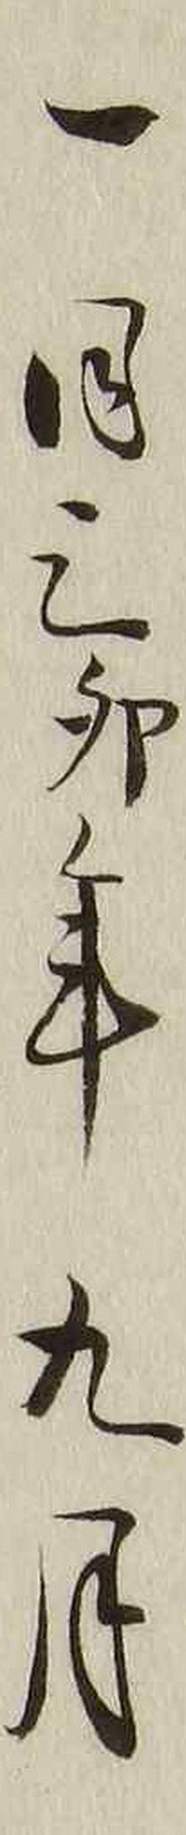一同三卯年九月
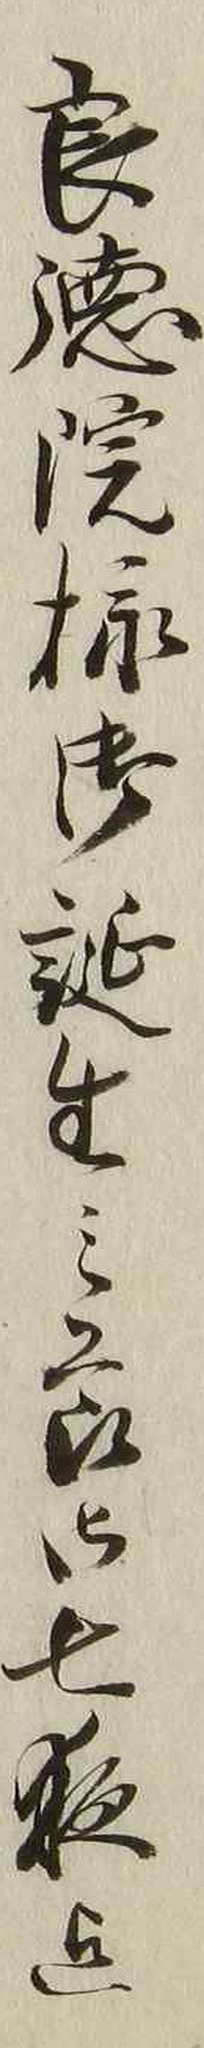良徳院様御誕生之節御七夜迄
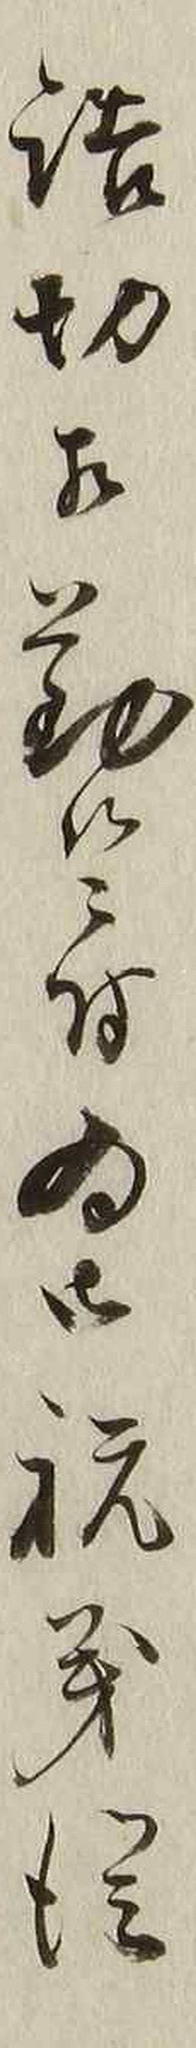詰切相勤候に付為御祝義従
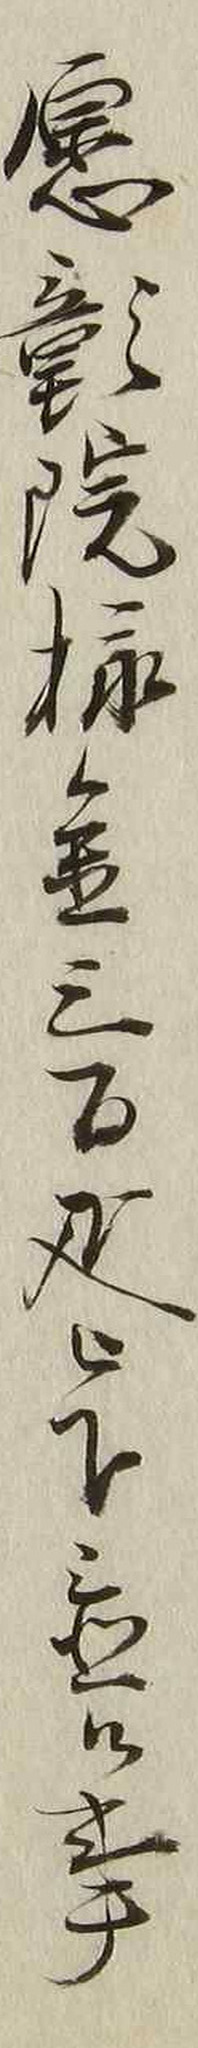愿彰院様金三百疋被下置候事
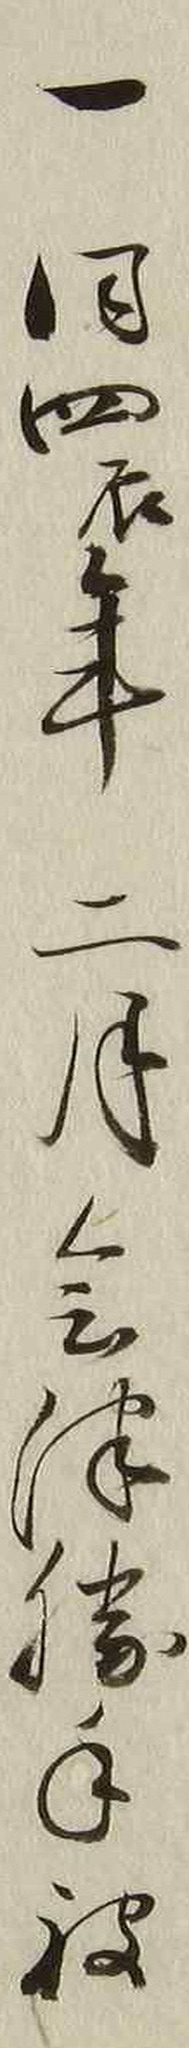一同四辰年二月会津勝手被
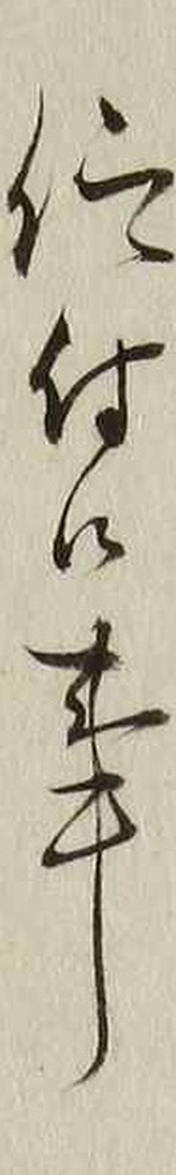仰付候事
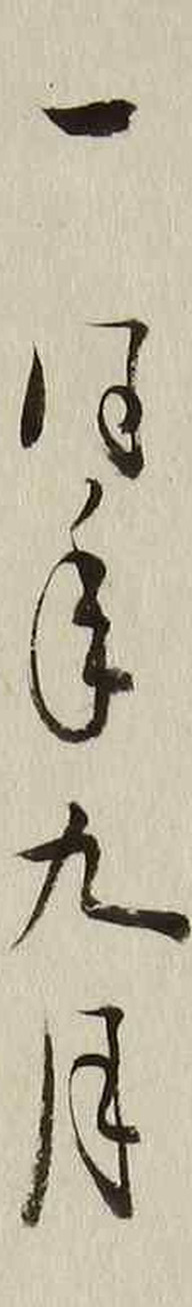一同年九月
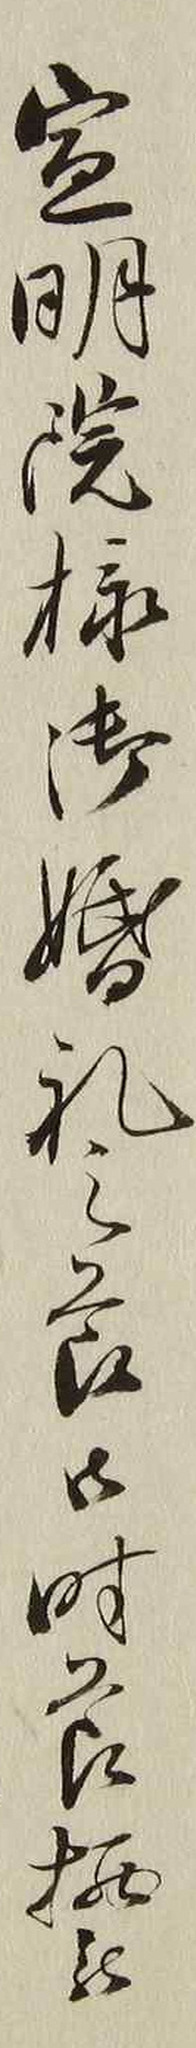宣明院様御婚礼之節御時節柄被
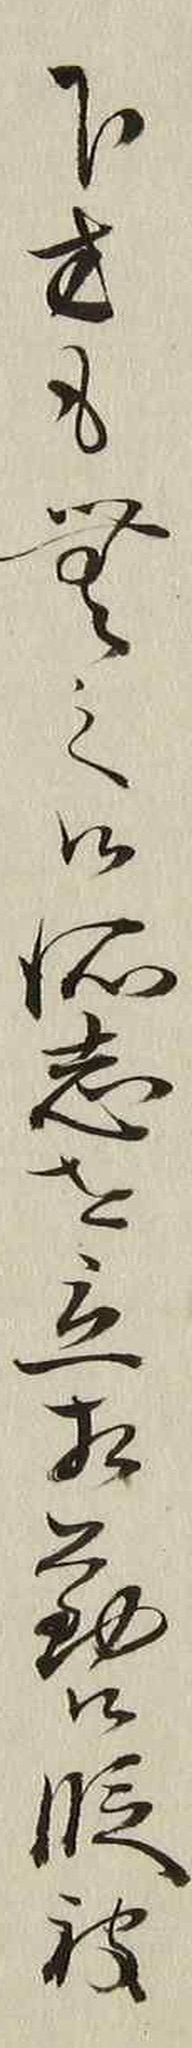下方も無之御所志を立相勤候段被
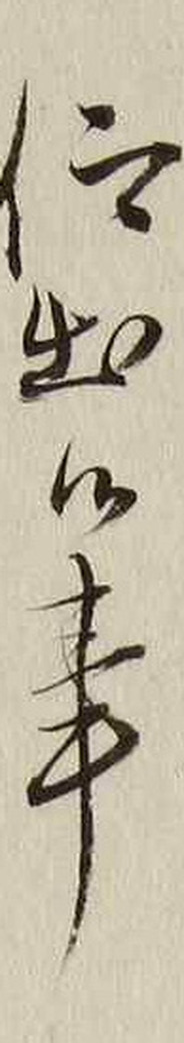仰出候事
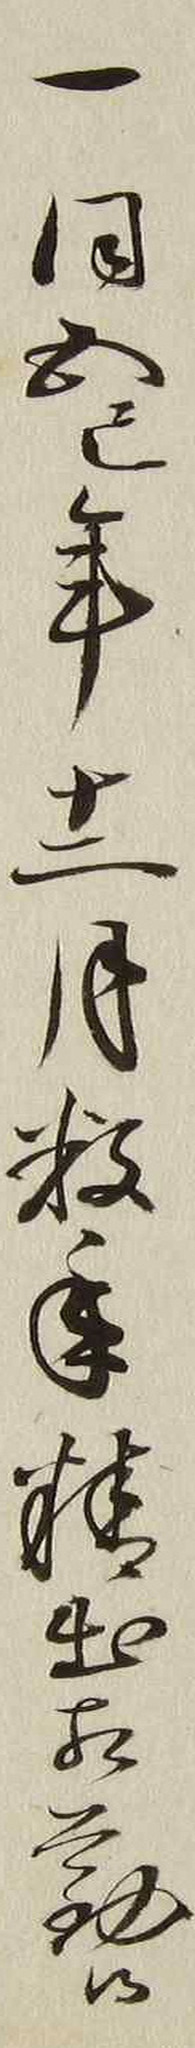一同五巳年十二月数年精出相勤候
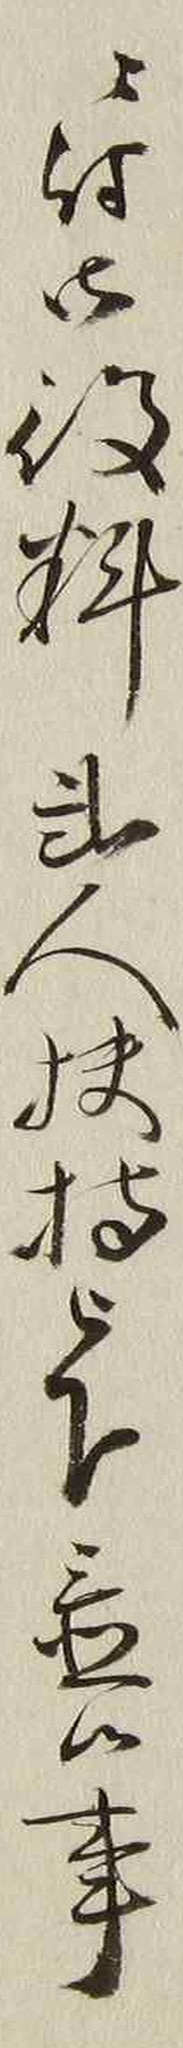に付御役料弐人扶持被下置候事
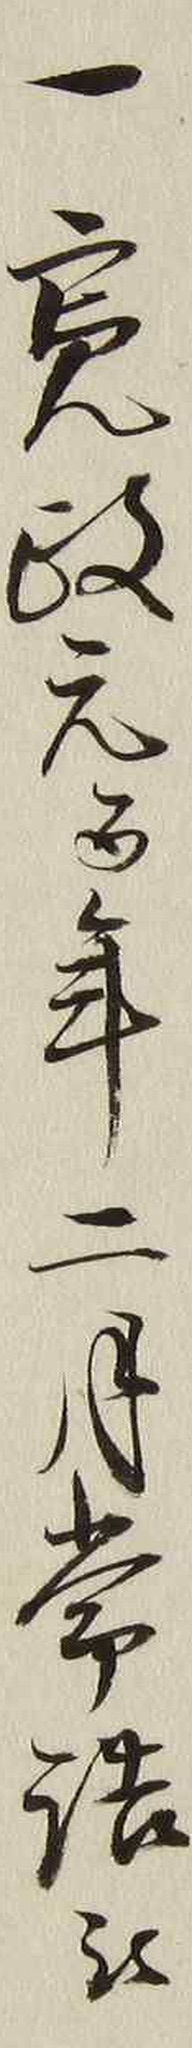一寛政元酉年二月常詰被
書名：諸士系譜　巻之157　ね之部1
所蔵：会津若松市立会津図書館
